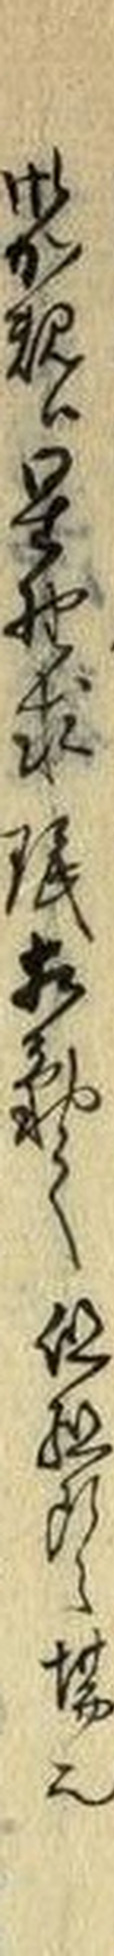御加規ハ星野求珉相勤之但組頭之場也
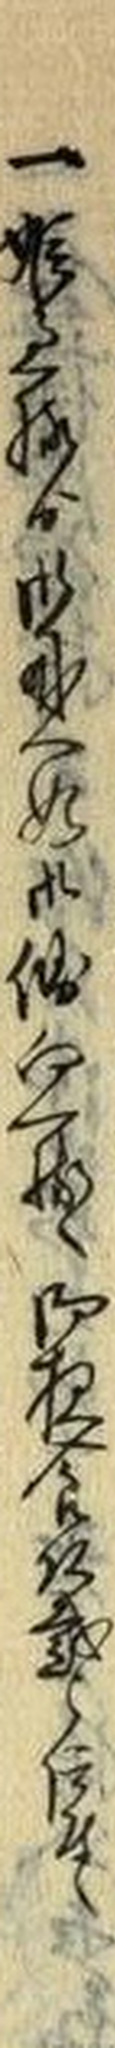一姫君様ゟ御用人始御側向一統へ御夜食頂戴被仰付候
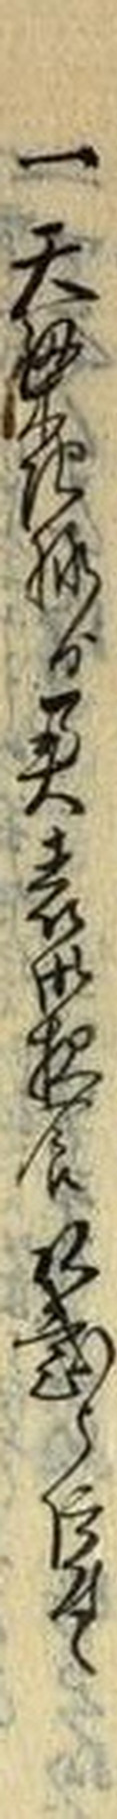一天梁院様ゟ奥表御夜食頂戴被仰付候
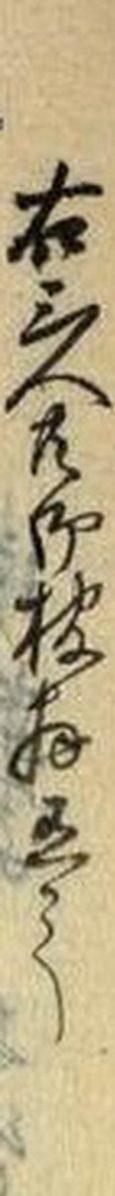右三人共御棺拝有之
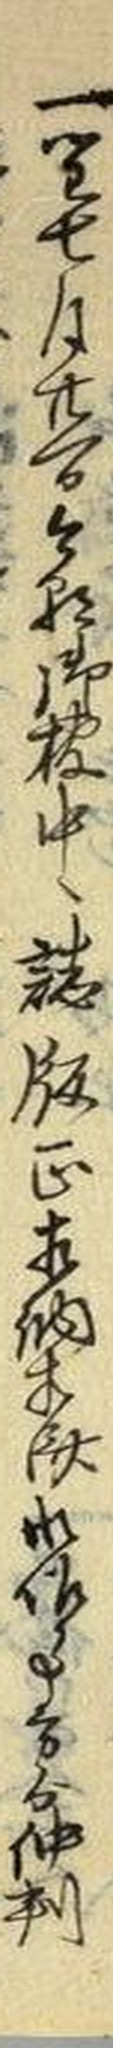一閏七月廿一日今朝御棺中へ誌版正相納相済御作事方ゟ仲判
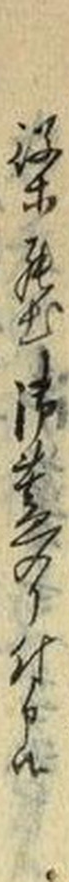役等罷出御蓋〆り付申候
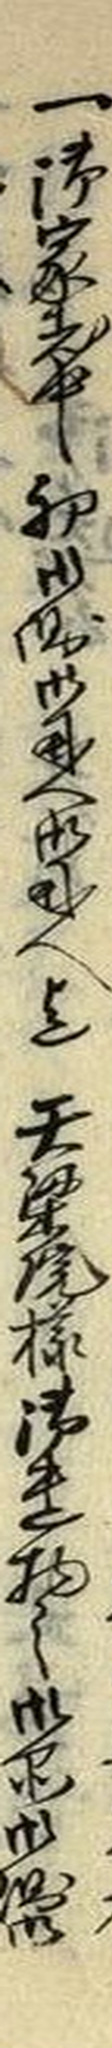一御家老中初御側御用人御用人迄天梁院様御遺物之御品御側御
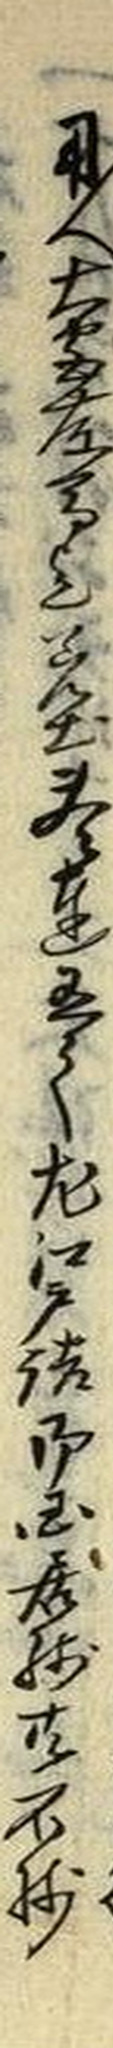用人大宮藤馬迄差出夫々達有之尤江戸詰御国居残共不残
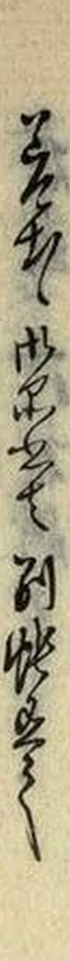差出候御品書は別帳有之
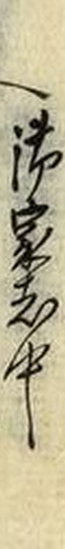御家老中
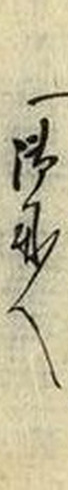御用人
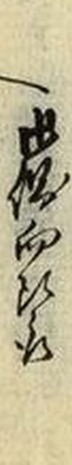御側向頭取
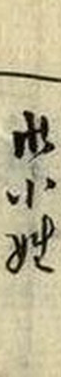御小姓
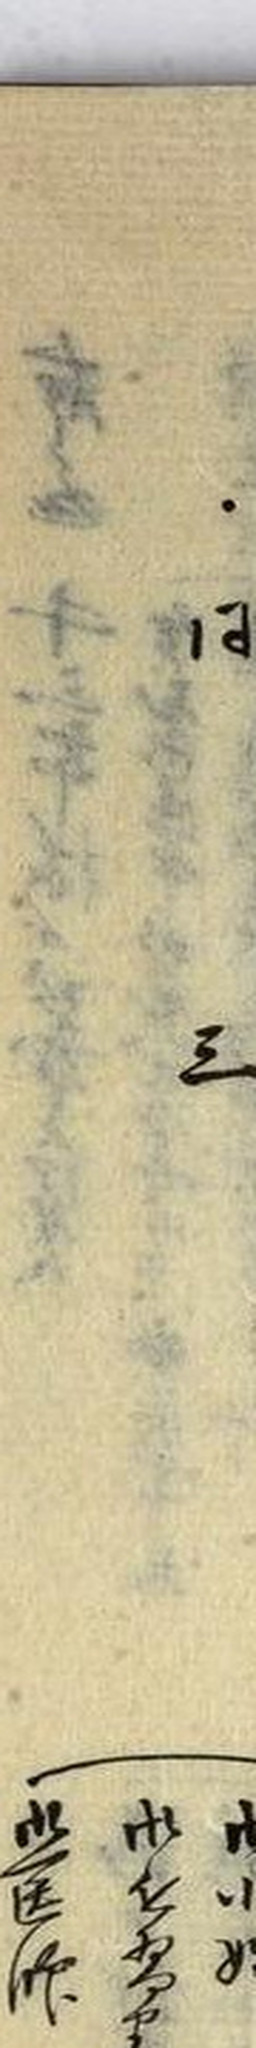御用人
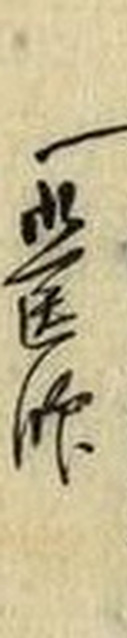御医師

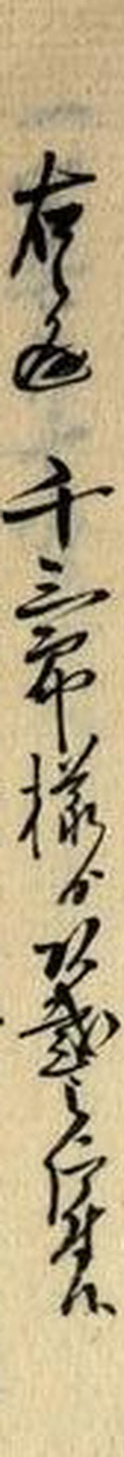右之通千三郎様ゟ頂戴被仰付候
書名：少傅日録抄（斉承付側向頭取日記、在府）
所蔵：福井県文書館 Fukui Prefectural Archives
